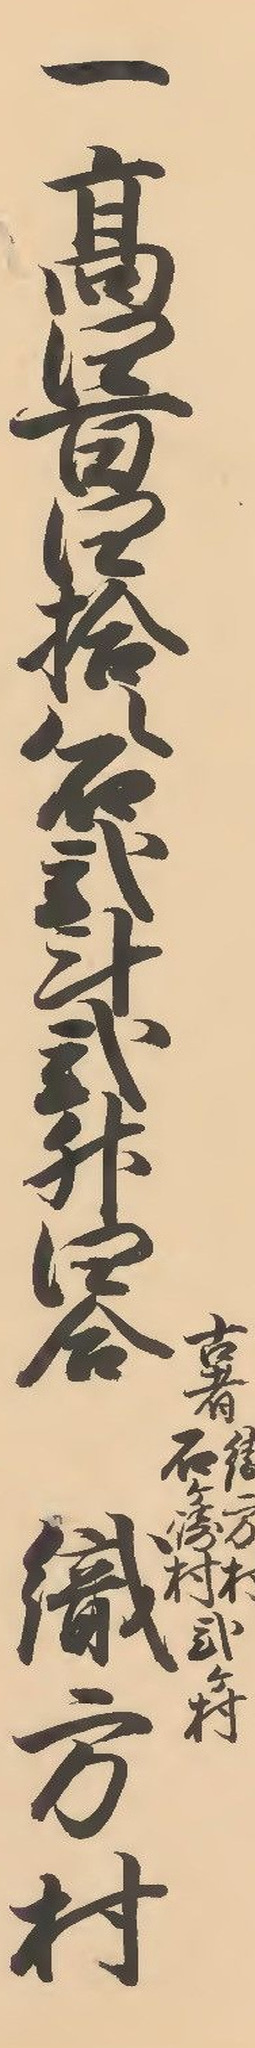一髙四百四拾八石弐斗弐升四合織方村

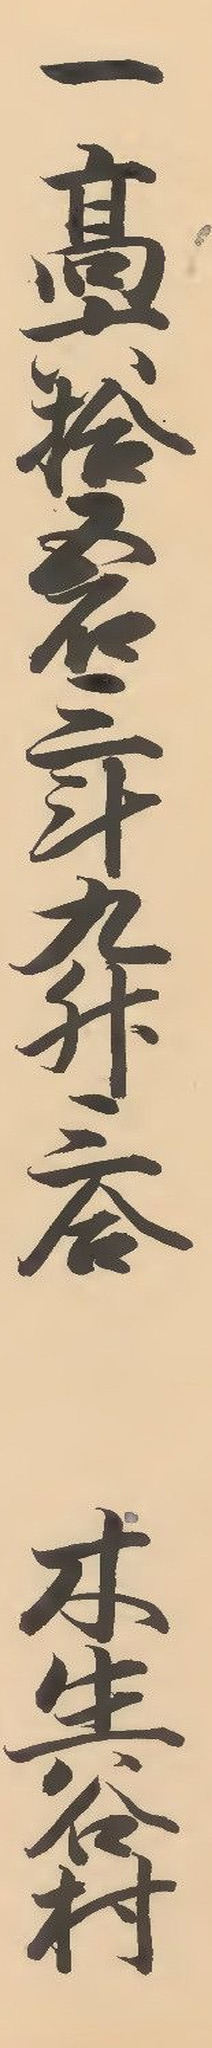一髙六拾五石三斗九升三合木生谷村
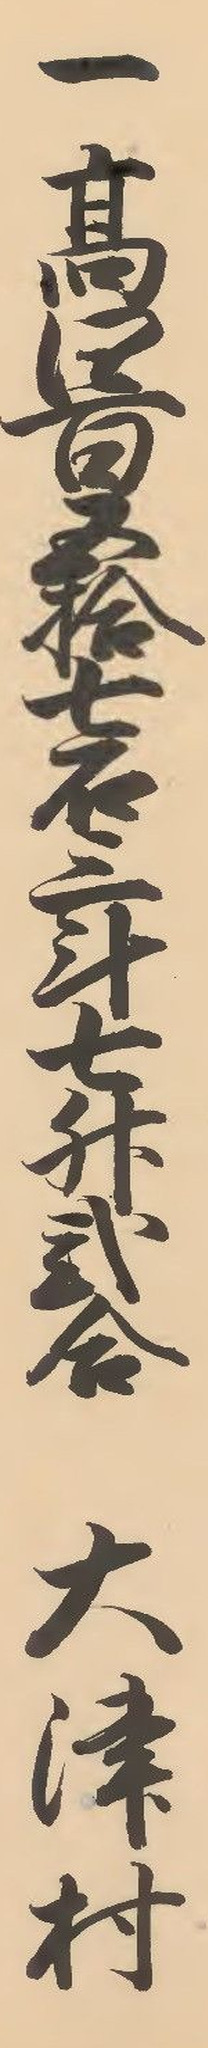一髙四百五拾七石三斗七升弐合大津村
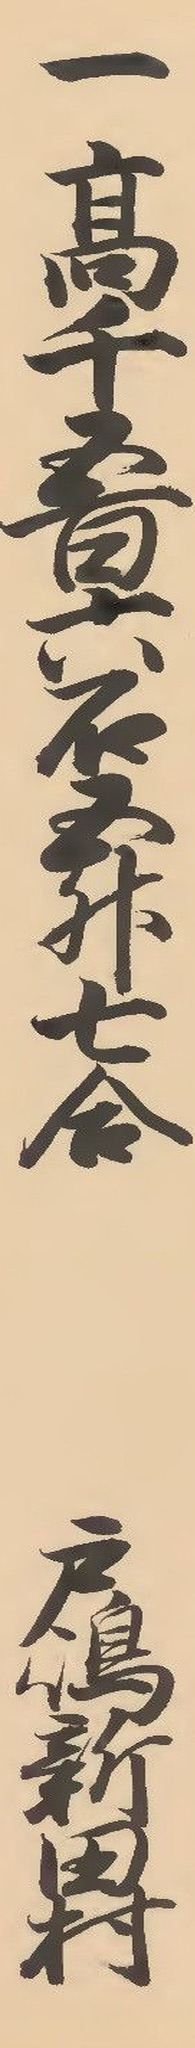一髙千五百六石五升七合戸嶋新田村
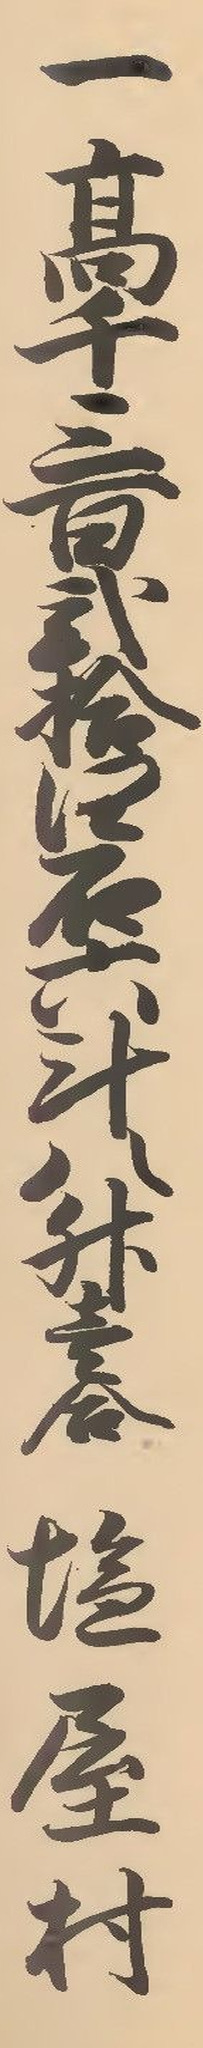一髙千三百弐拾四石六斗八升壱合塩屋村
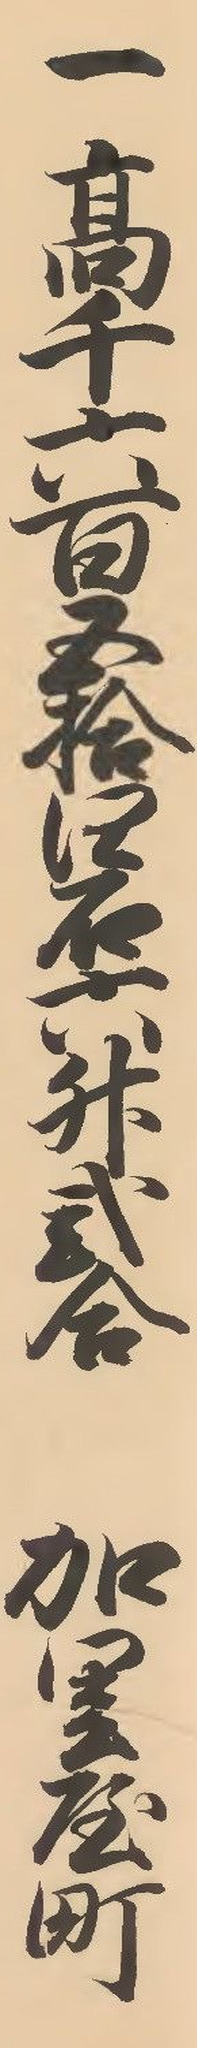一髙千六百五拾四石六升弐合加里屋町
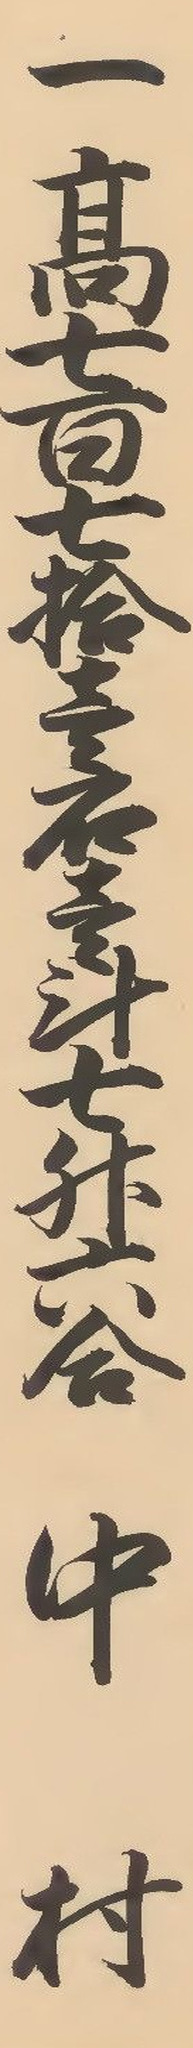一髙七百七拾壱石壱斗七升六合中村
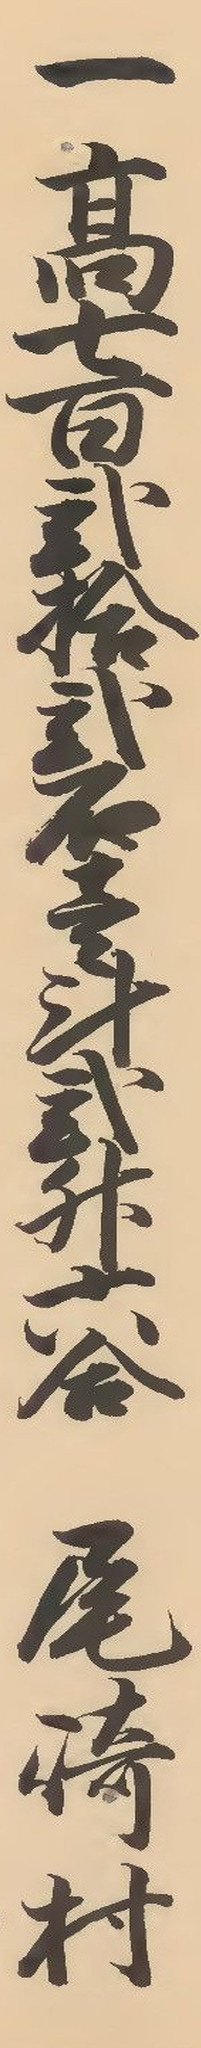一髙七百弐拾弐石壱斗弐升六合尾崎村
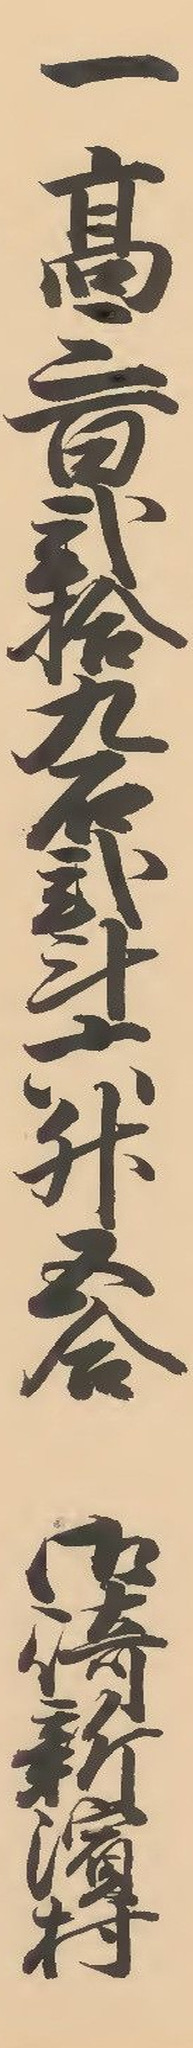一髙三百弐拾九石弐斗六升五合御崎新濱村

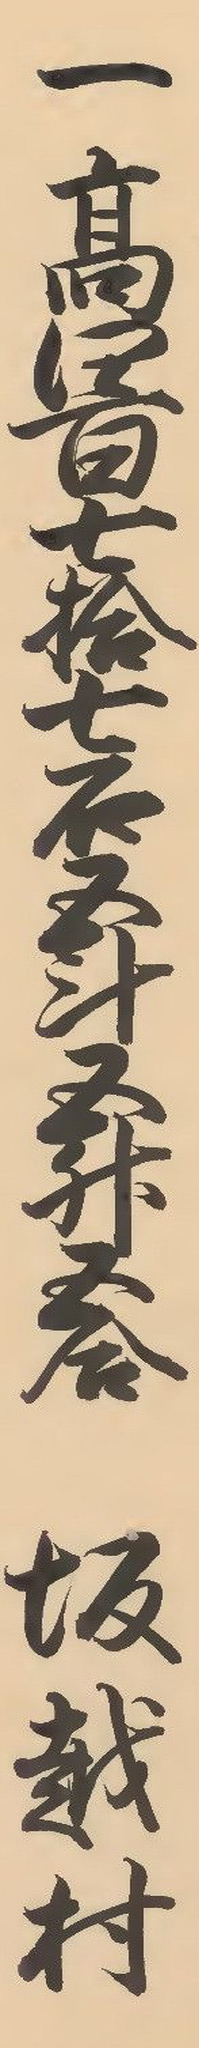一髙四百七拾七石五斗五升五合坂越村
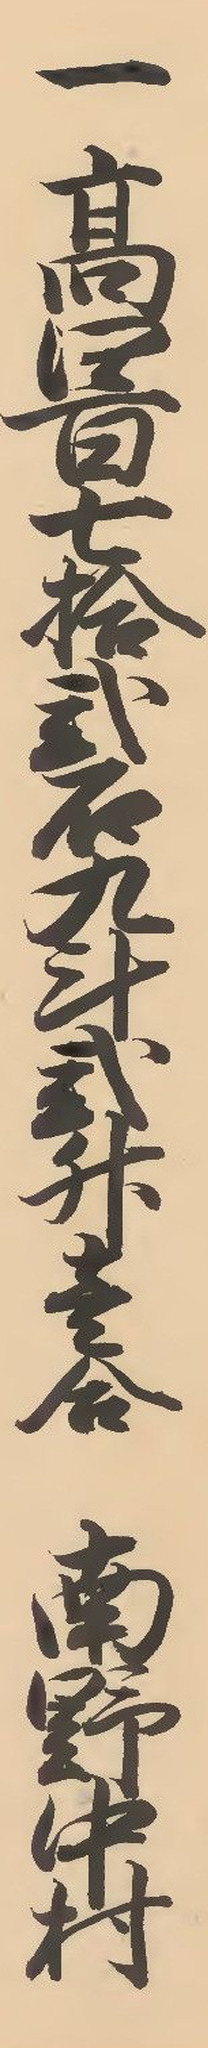一髙四百七拾弐石九斗弐升壱合南野中村
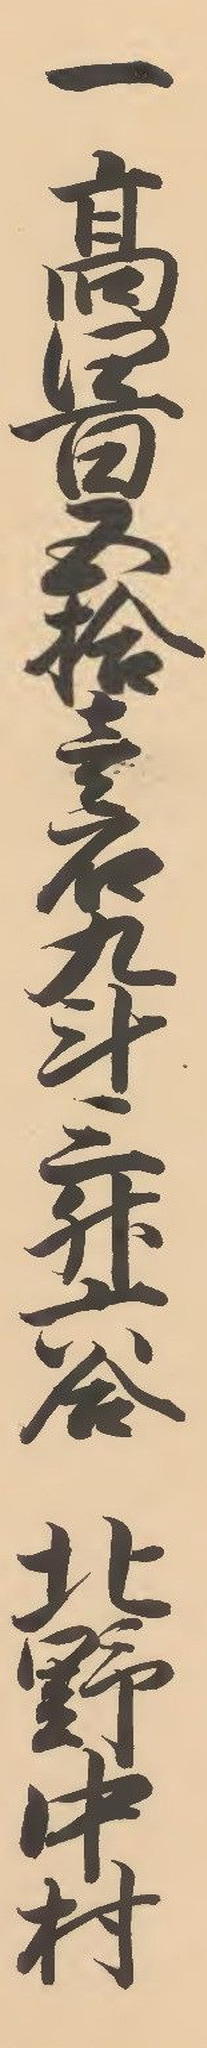一髙四百五拾壱石九斗三升六合北野中村
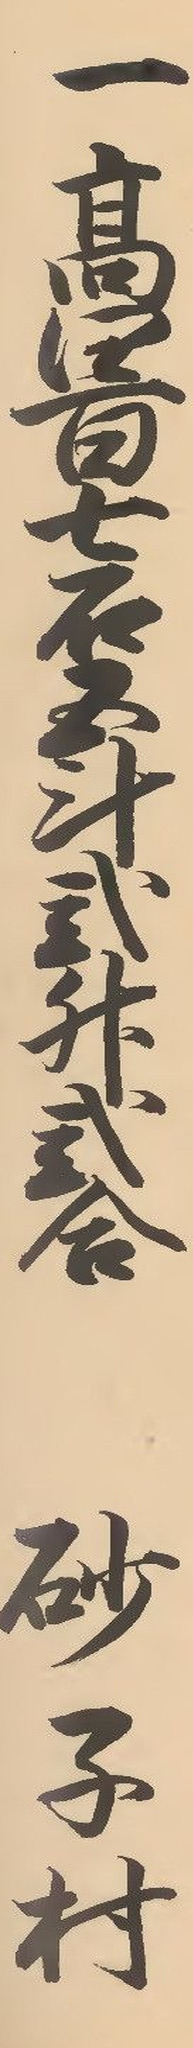一髙四百七石五斗弐升弐合砂子村
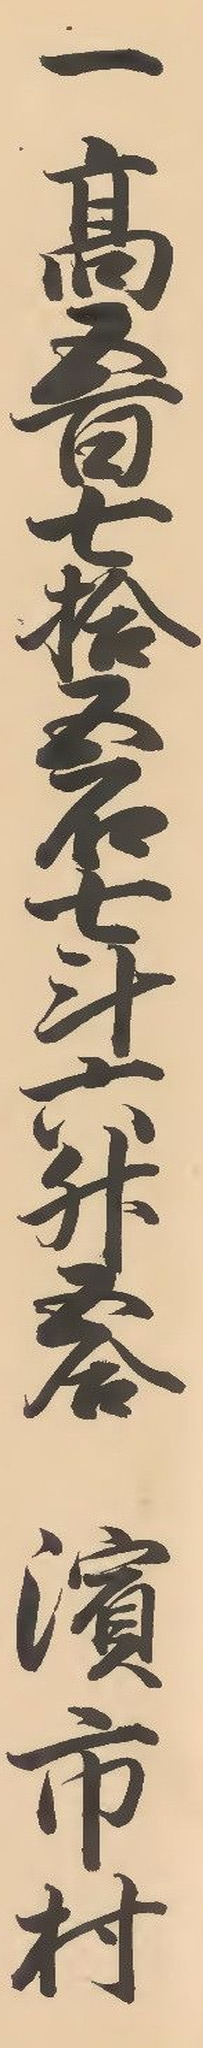一髙五百七拾五石七斗六升五合濱市村
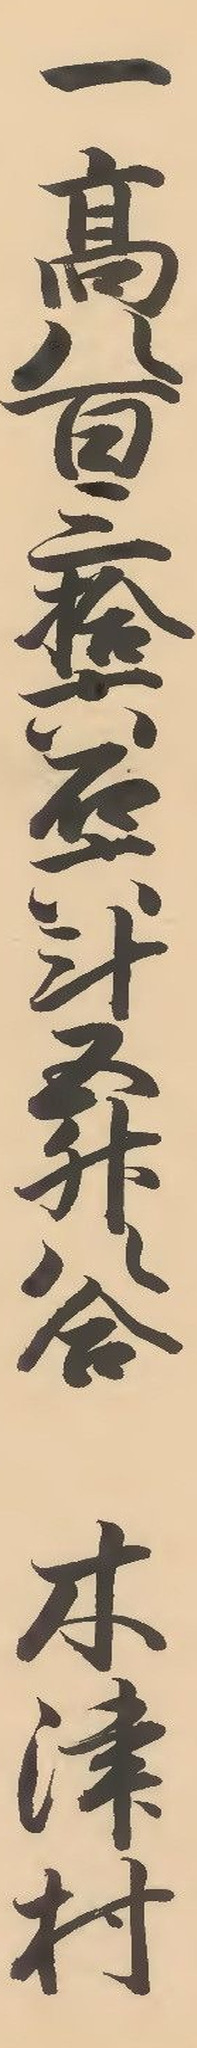一髙八百三拾六石六斗五升八合木津村
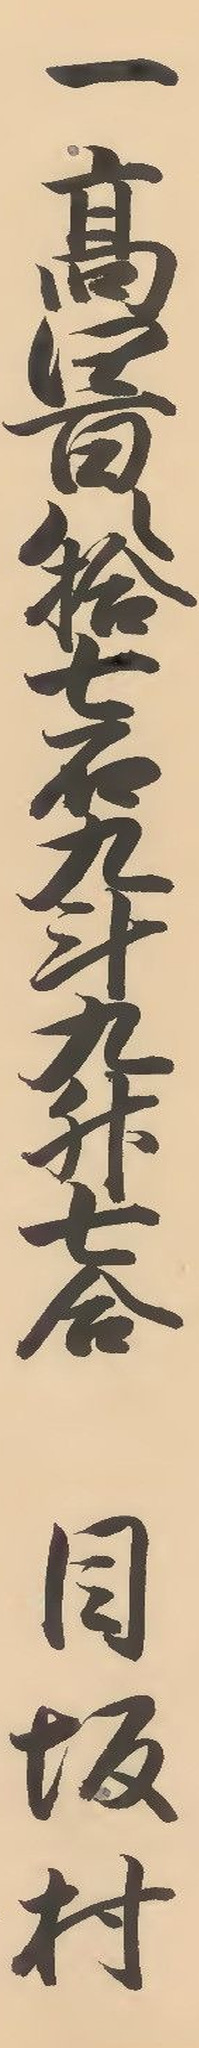一髙四百八拾七石九斗九升七合目坂村
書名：播磨国郷帳
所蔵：国立公文書館 National Archives of Japan
